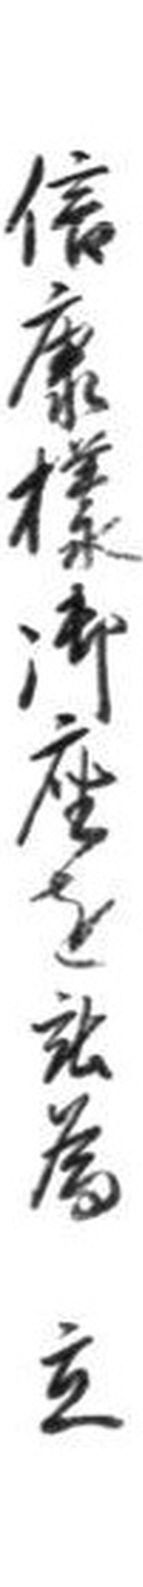信康様御座を被為立
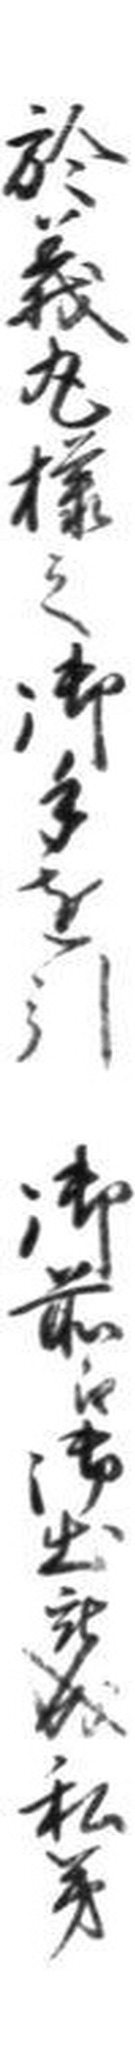於義丸様之御手を引御前江御出被成私弟
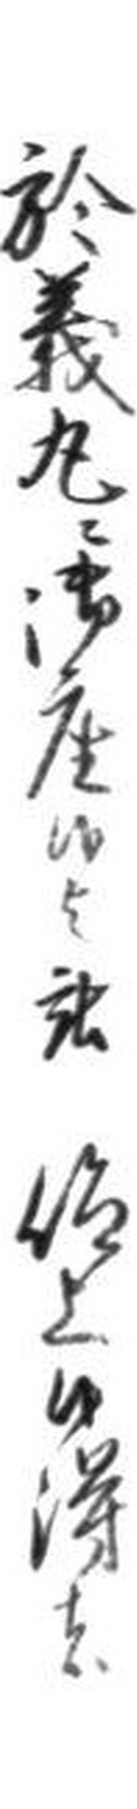於義丸ニ御座候与被仰上候得者
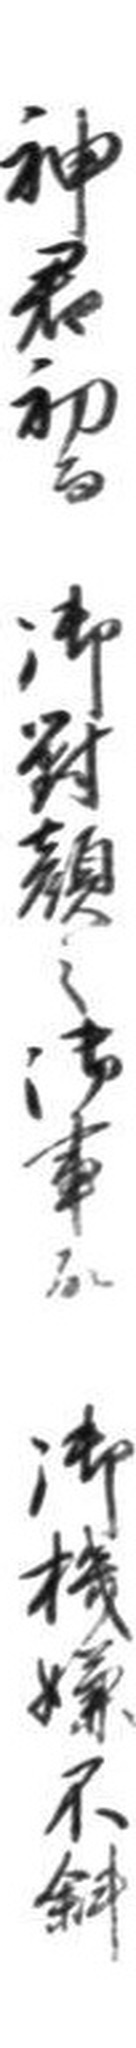神君初而御対顔之御事故御機嫌不斜
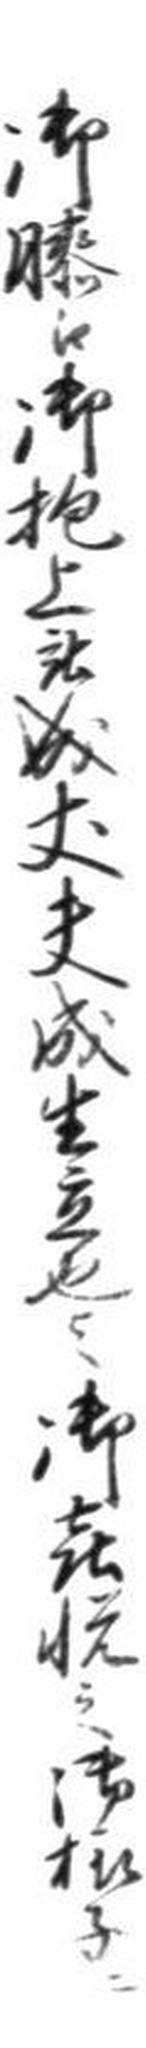御膝江御抱上被成丈夫成生立也与御喜悦之御様子ニ
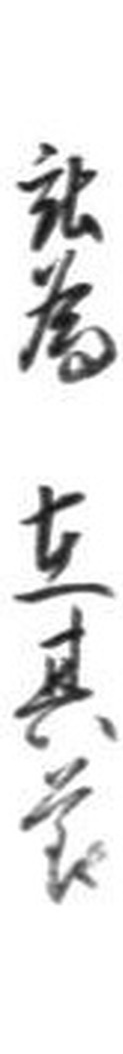被為在其節
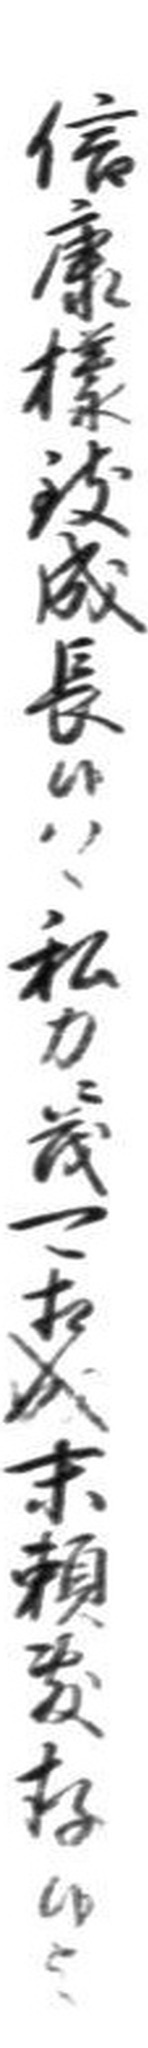信康様致成長候ハヽ私力ニ茂可相成末頼敷存候与
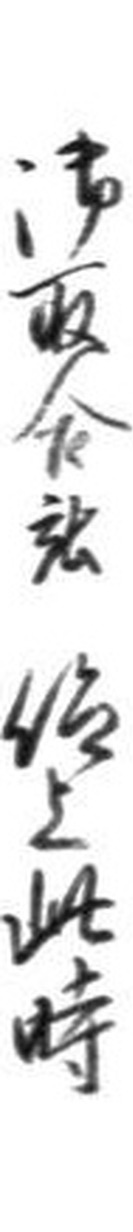御取合被仰上此時
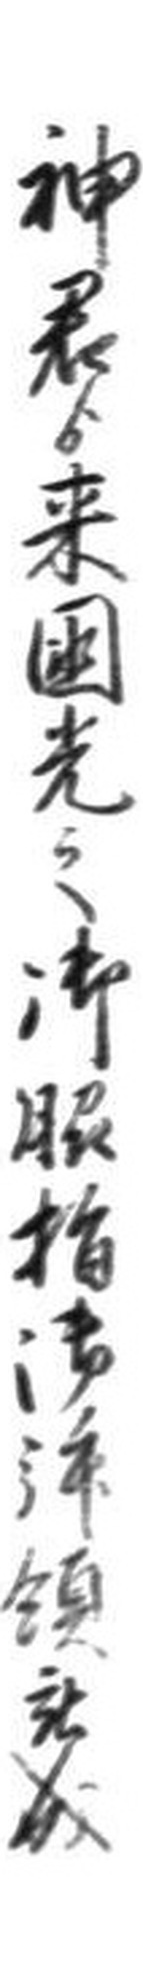神君ゟ来国光之御脇指御拝領被成

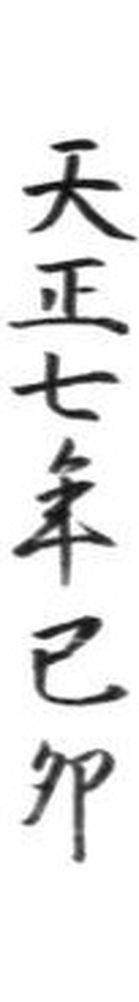天正七年己卯
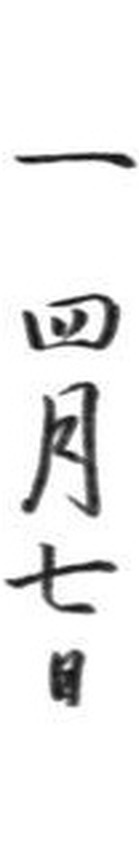一四月七日
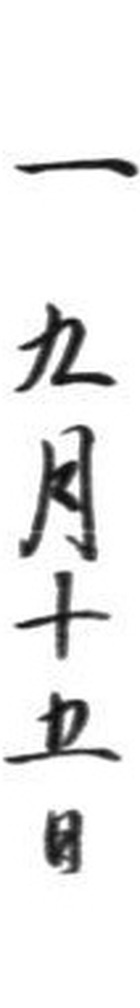一九月十五日
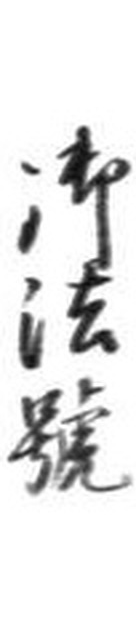御法号
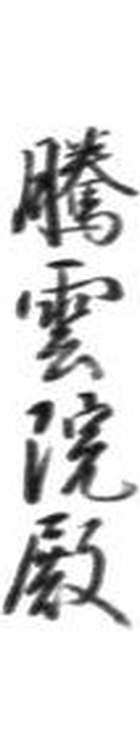騰雲院殿
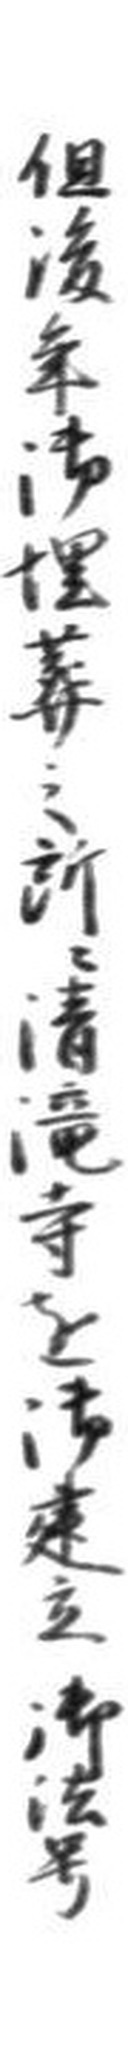但後年御埋葬之所ニ清滝寺を御建立御法号
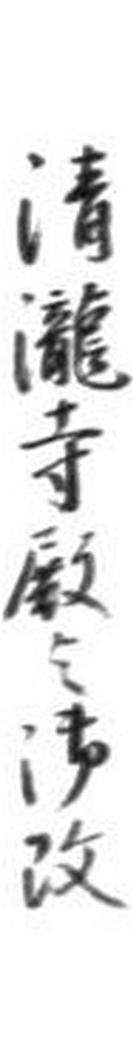清瀧寺殿与御改
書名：家譜 一 秀康公 従天正二年到慶長十二年
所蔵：福井県文書館 Fukui Prefectural Archives
